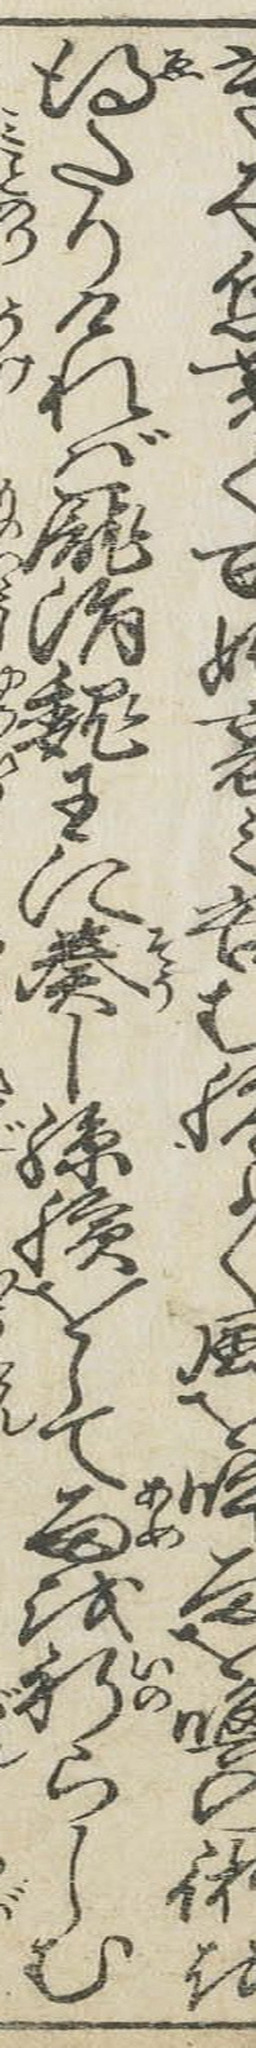得たりければ龐涓魏王に奏し孫臏をして雨を祈らしむ
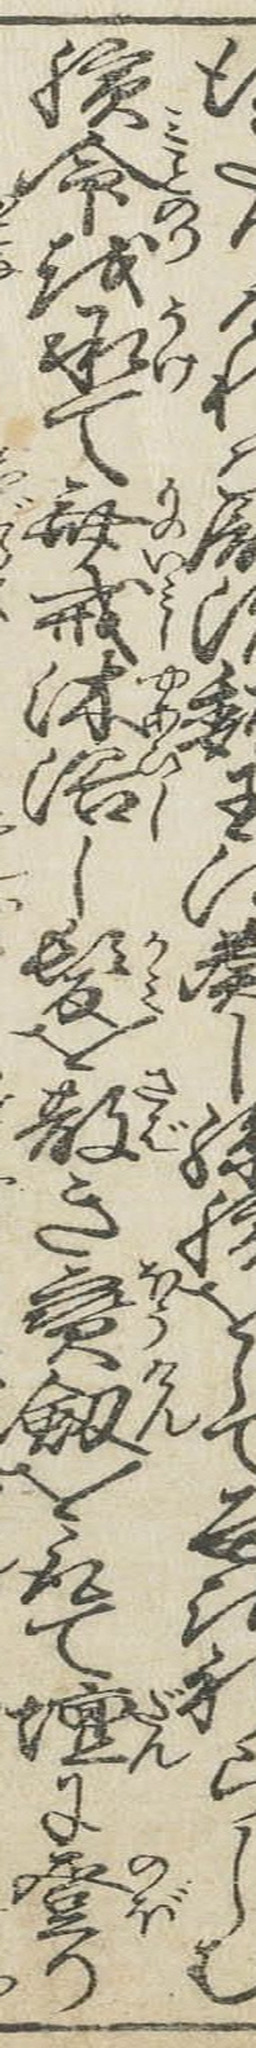臏命を承て斎戒沐浴し髪を散き宝剣を取て壇に登り
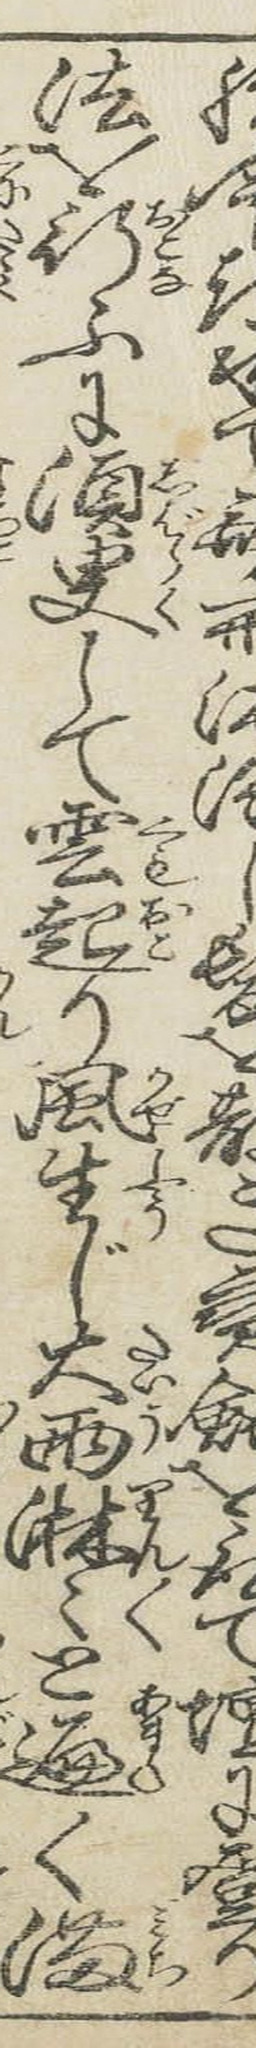法を行ふに須臾して雲起り風生じ大雨淋々と遍く満
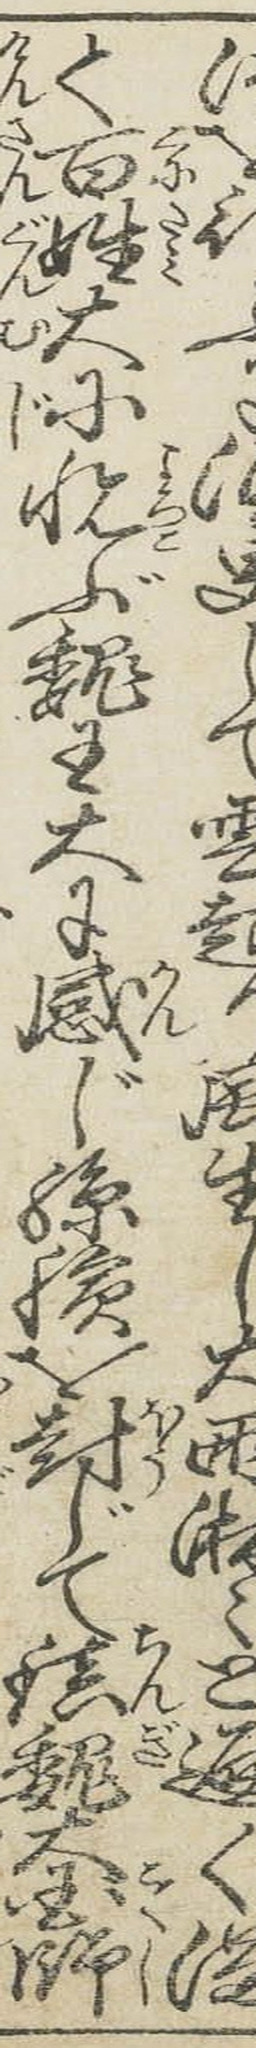て百姓大に悦ぶ魏王大に感じ孫臏を封じて鎮魏大国師
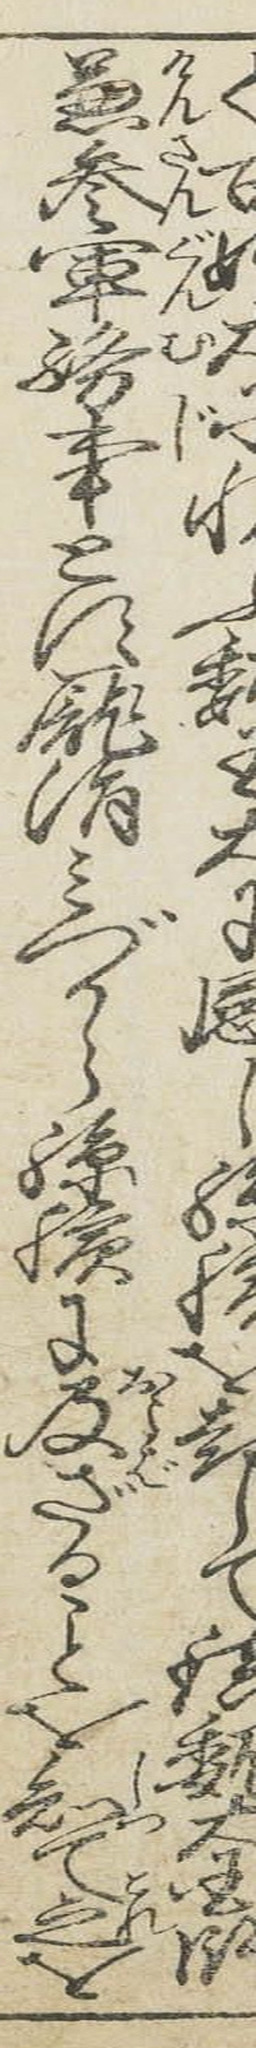兼参軍務事とす龐涓みづから孫臏に及ざることを知て之を
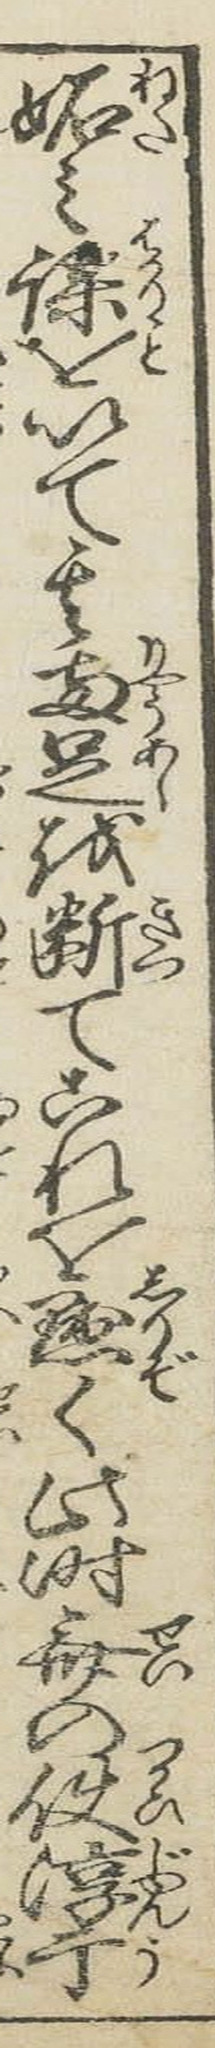妬み謀を以て其両足を断てこれを黜く此時斉の使淳于
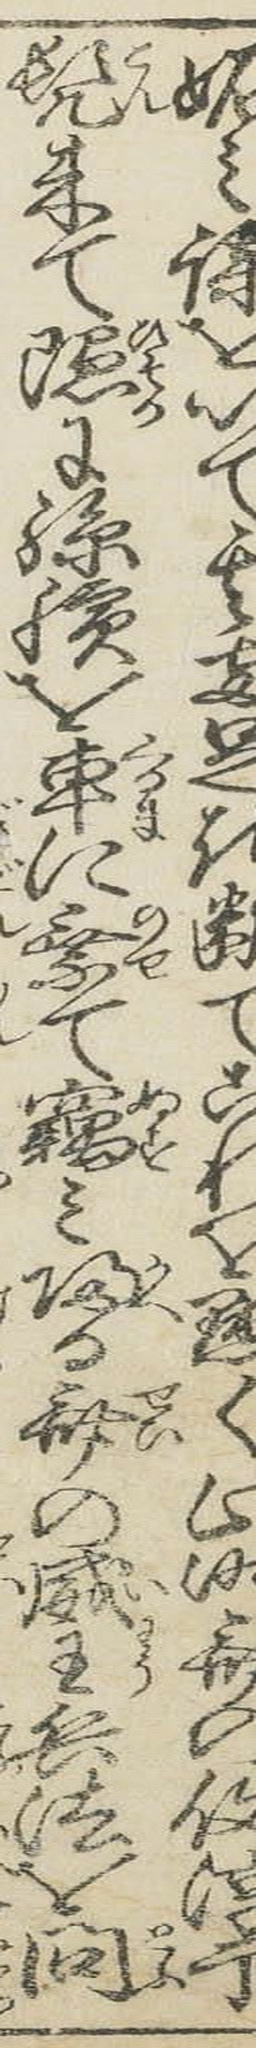髠来て隠に孫臏を車に乗て窃み帰る斉の威王兵法を問
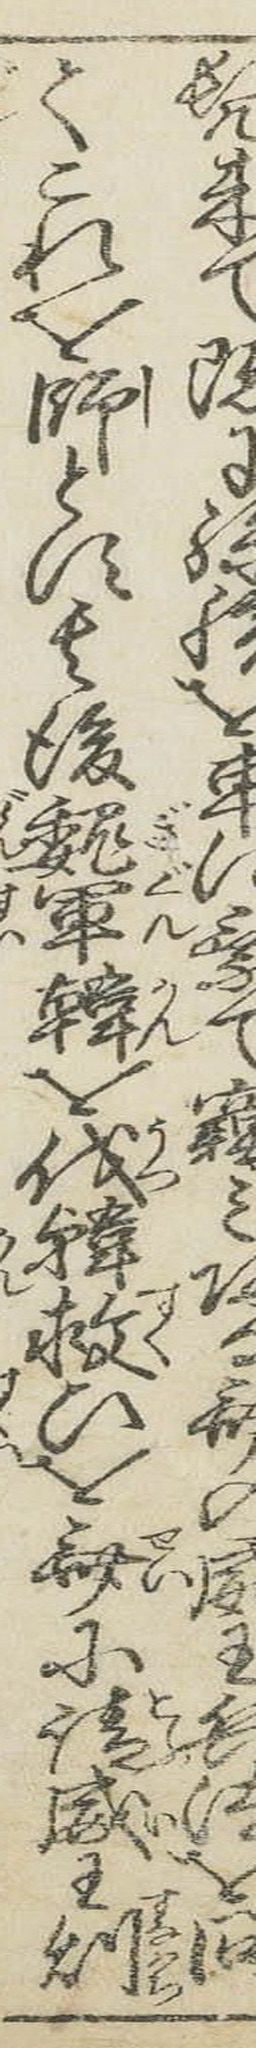てこれを師とす其後魏軍韓を伐韓救ひを斉に請威王則
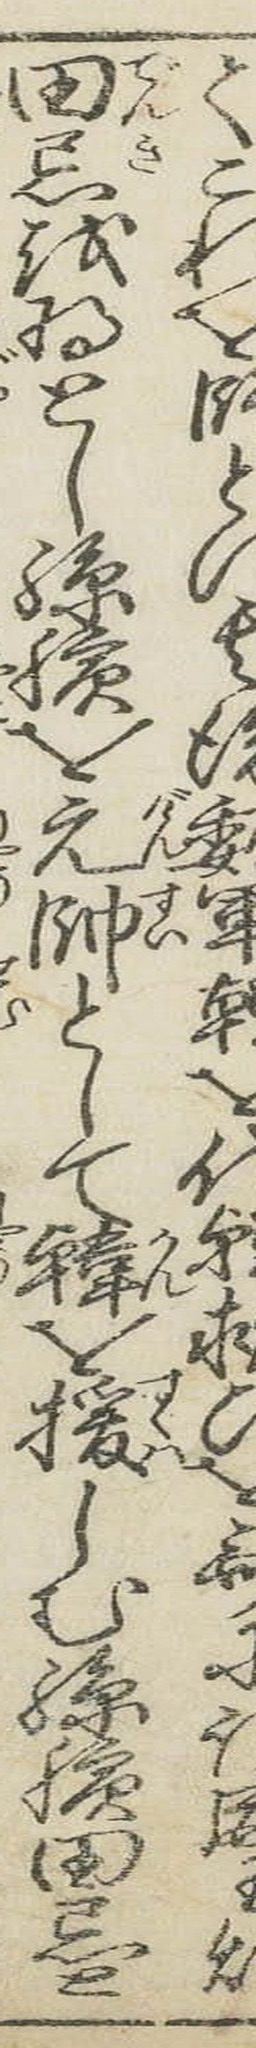田忌を将とし孫臏を元帥として韓を援しむ孫臏田忌と
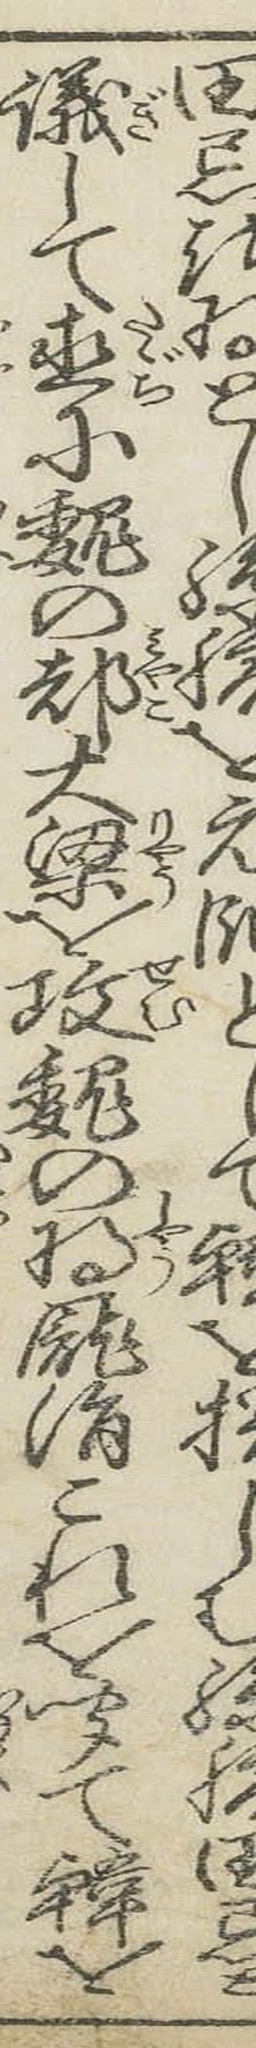議して直に魏の都大梁を攻魏の将龐涓これを聞て韓を
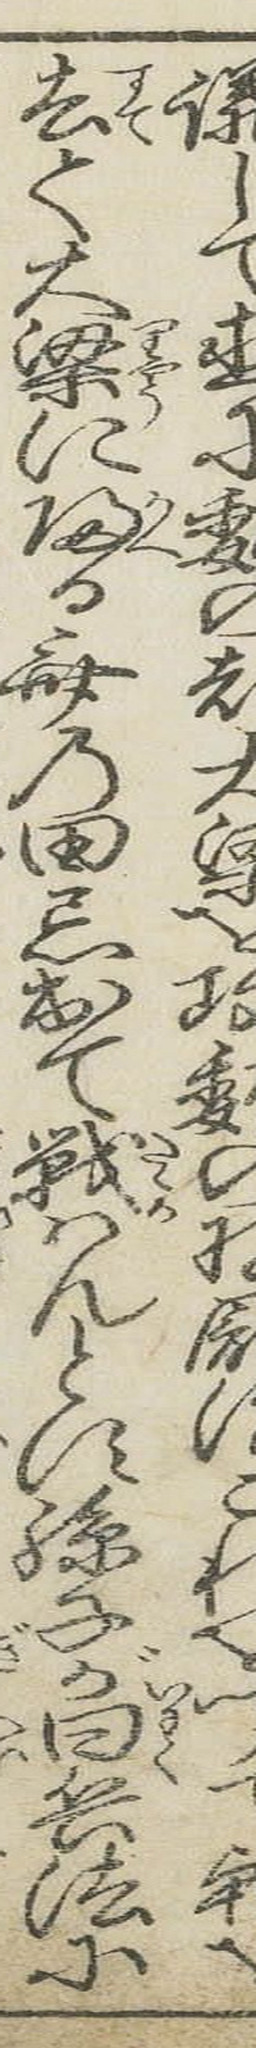去て大梁に帰る斉の田忌出て戦はんとす孫子が曰兵法に
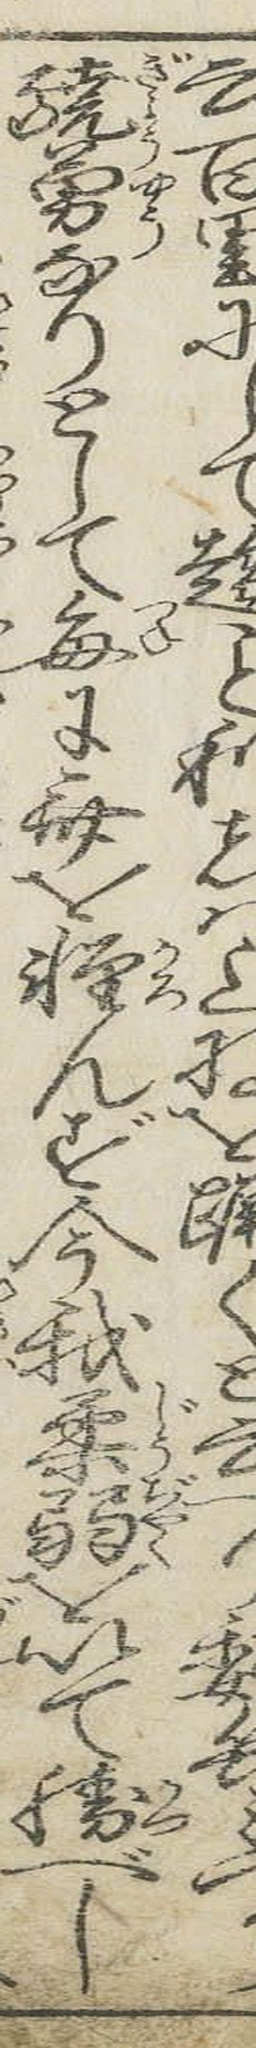驍勇なりとして毎に斉を軽んず今我柔弱を以て勝べし
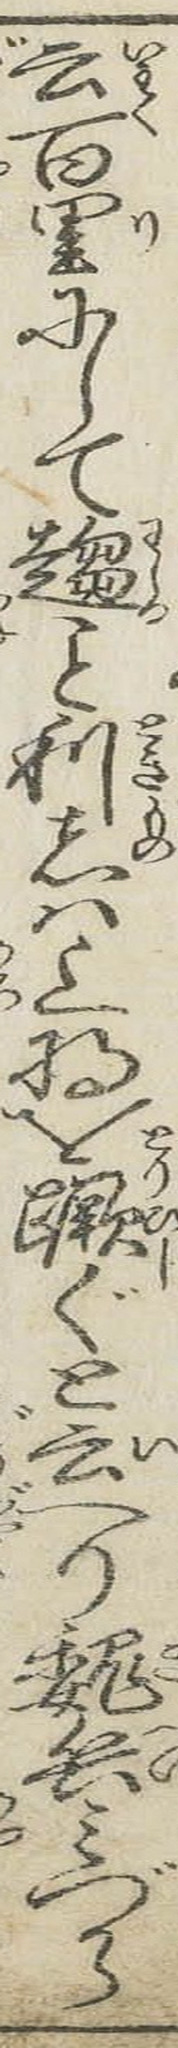云百里にして趨こと利者は上将を蹶ぐと云へり魏兵みづから
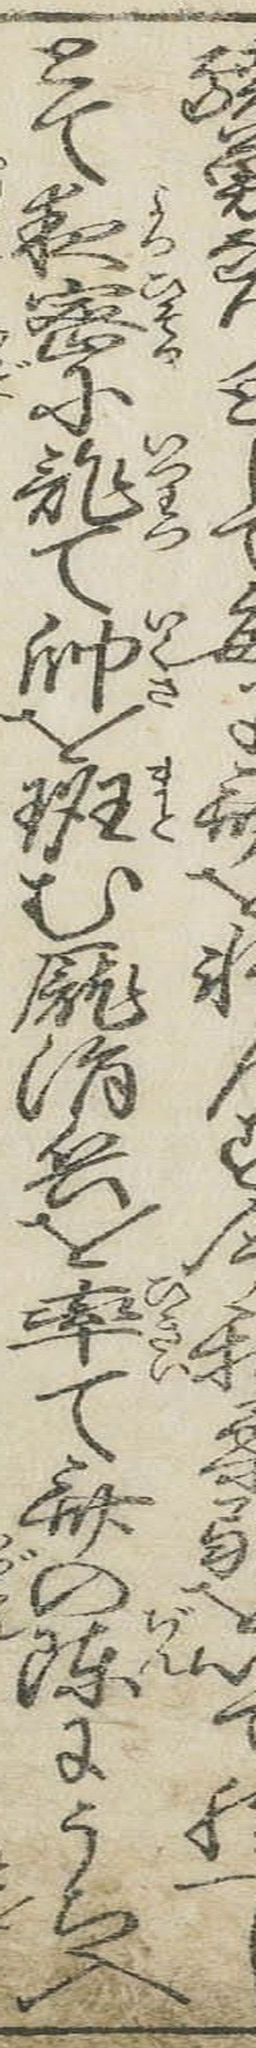とて夜密に詐て師を班む龐涓兵を率て斉の陣にうつ入
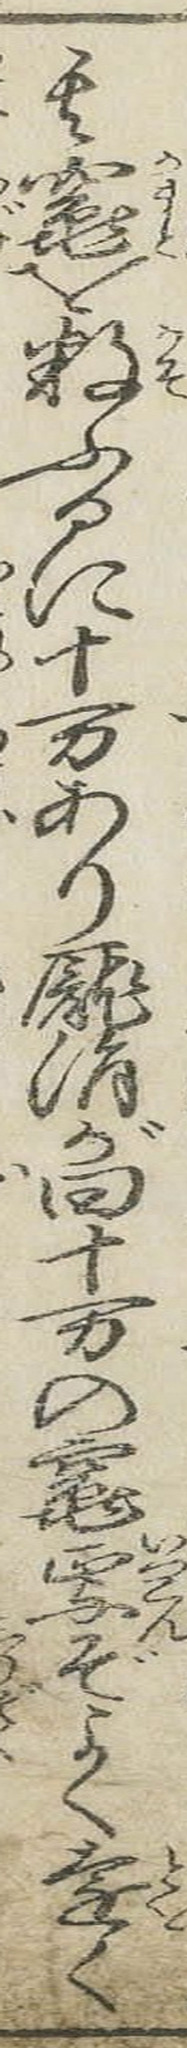其竈を数ふるに十万あり龐涓が曰十万の竈焉ぞよく遠く
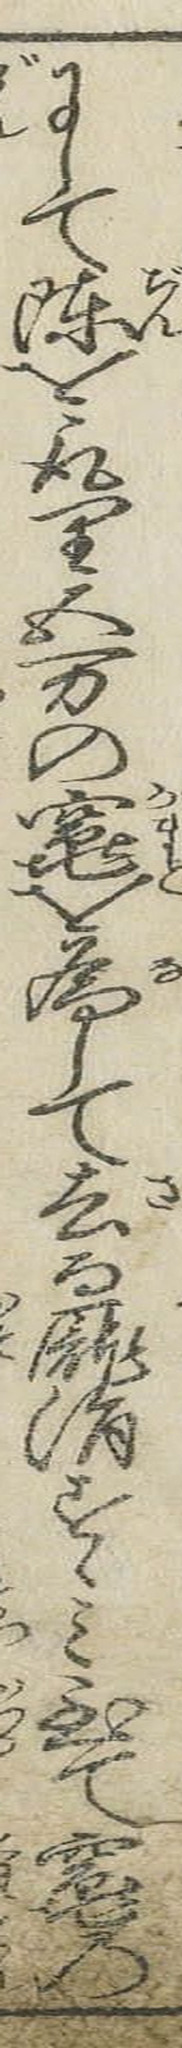にして陣を取り五万の竈を為して去る龐涓すゝみ至て竃の
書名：絵本写宝袋 9巻 6之巻
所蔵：東京学芸大学教育コンテンツアーカイブ
